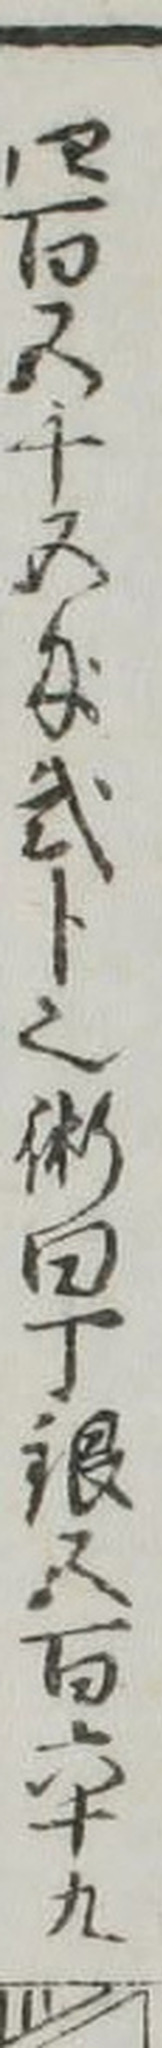四百五十五匁弐分也術曰丁銀五百六十九
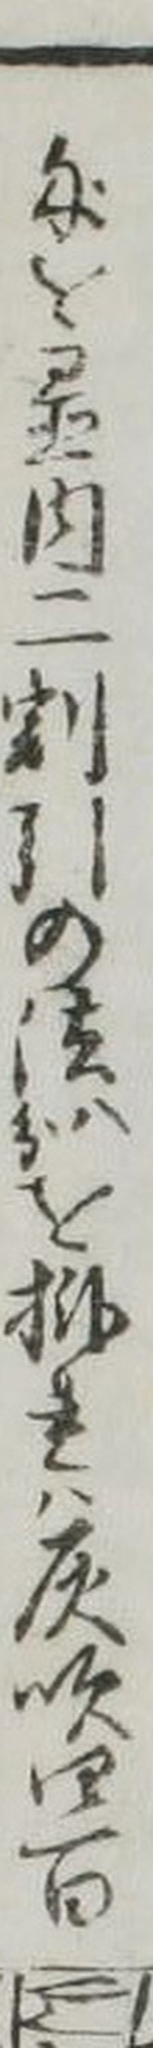匁を置内二割引の法八分を掛れは灰吹四百
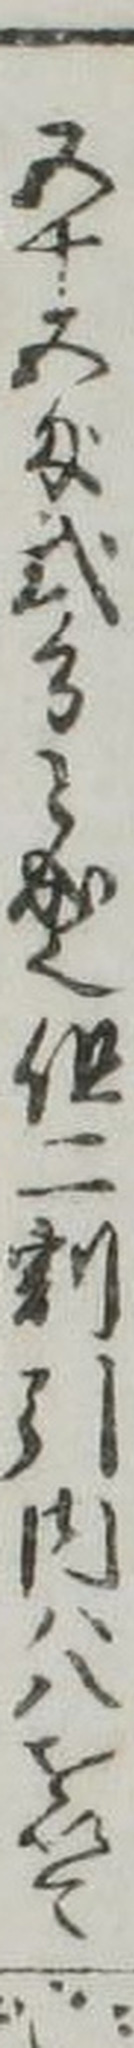五十五匁弐分と成也但二割引内は八を以て
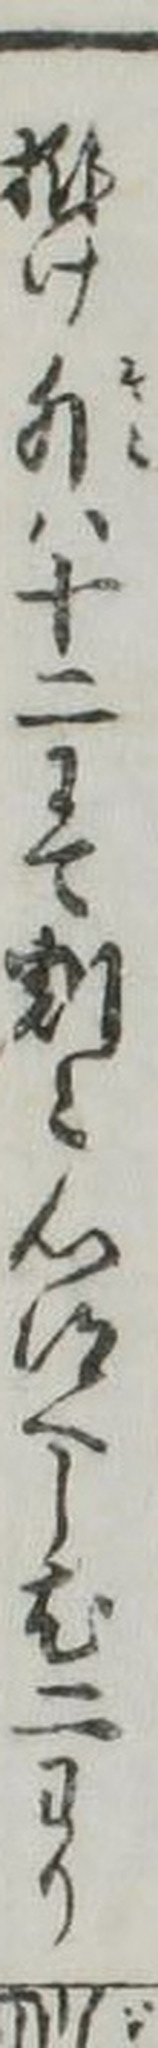掛け外は十二にて割と心得へし尤二わり
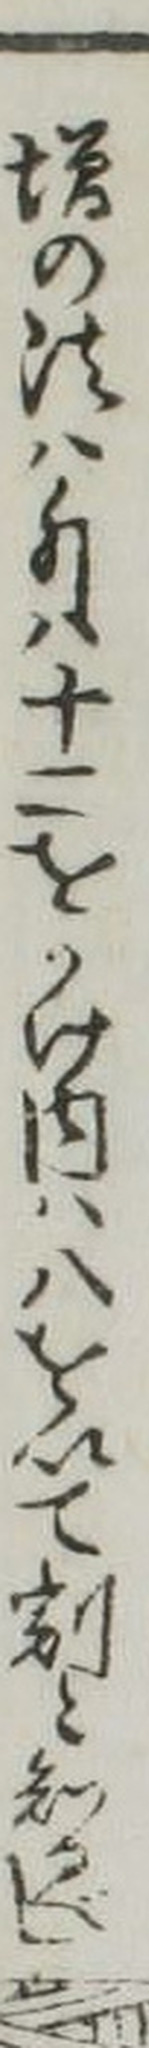増の法は外は十二をかけ内は八を以て割と知るべし
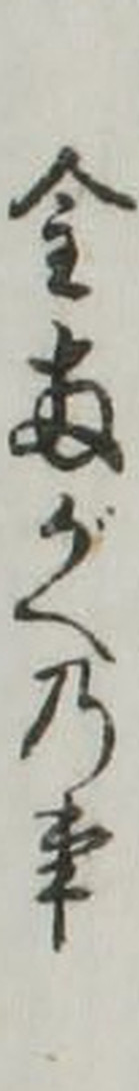○金両がへの事
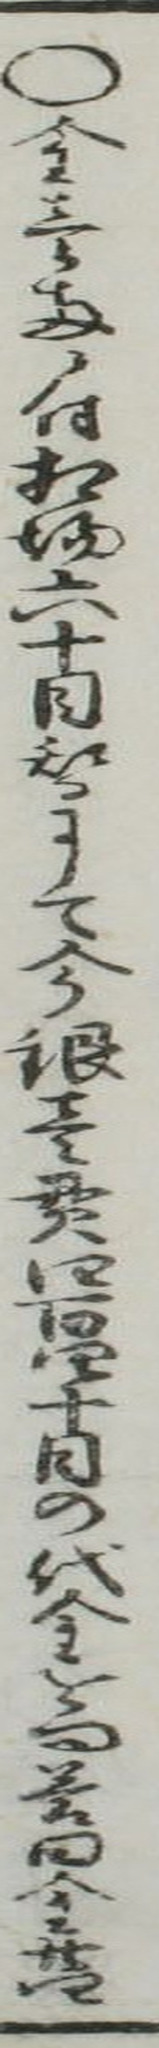○金壱両に付相場六十目替にして今銀壱貫四百四十目の代金を問答曰金廿四
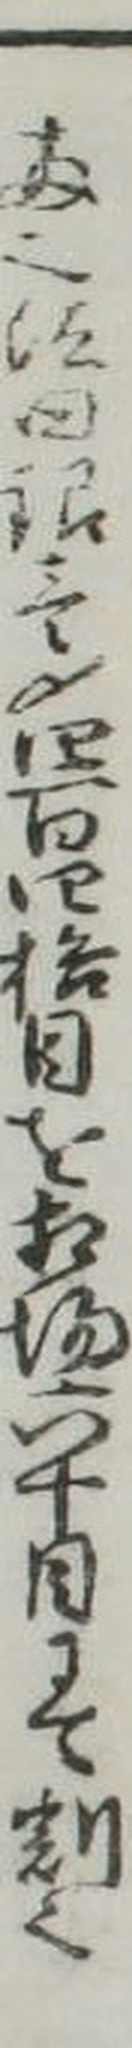両也法曰銀壱貫四百四拾目を相場六十目にて割也

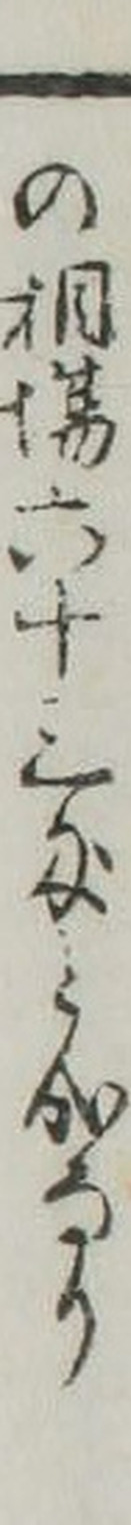の相場六十三匁と成なり
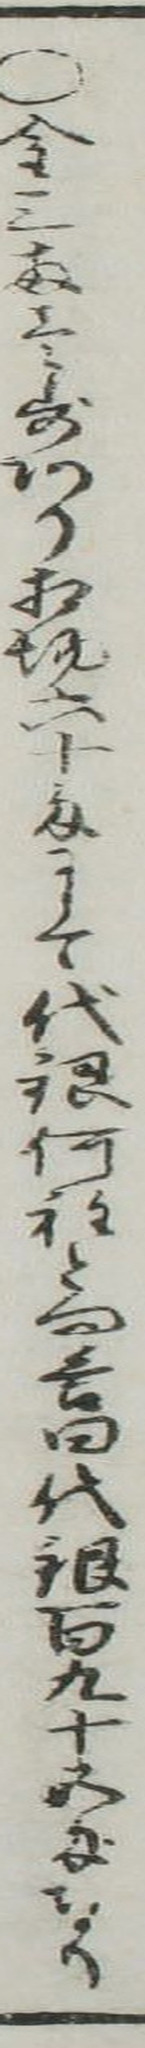○金三両壱歩あり相場六十匁にして代金何程と問曰答曰代銀百九十五匁なり
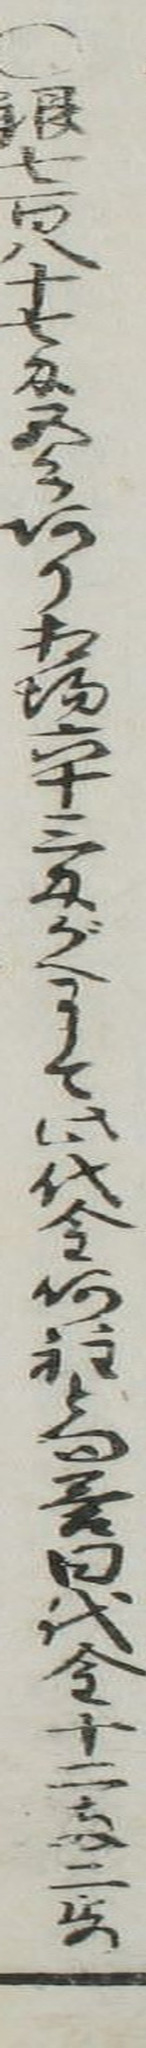○銀七百八十七匁五分あり相場六十三匁がへにして此代金何程と問答曰代金十二両二歩
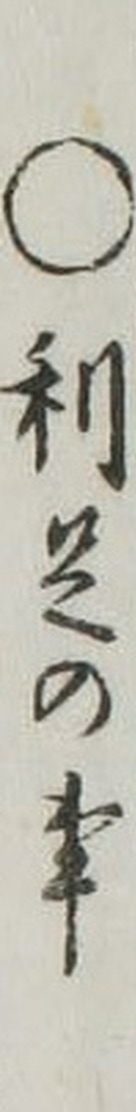○利足の事
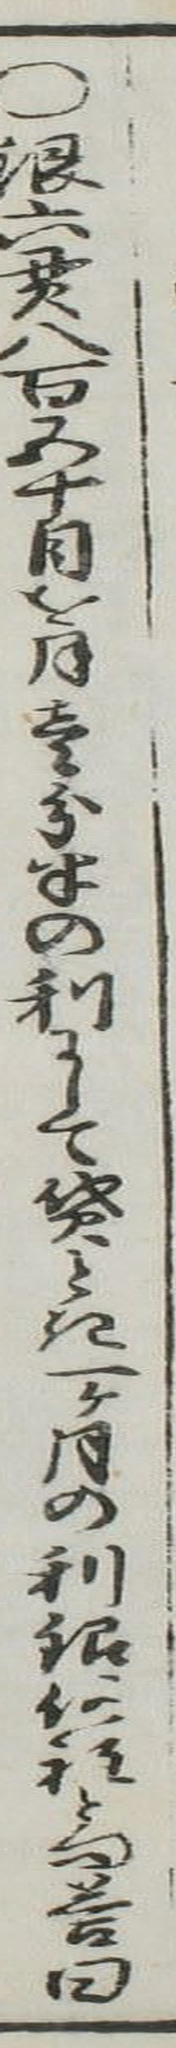○銀六貫八百五十目を月壱分半の利にして貸とき一ヶ月の利銀何程と問答曰
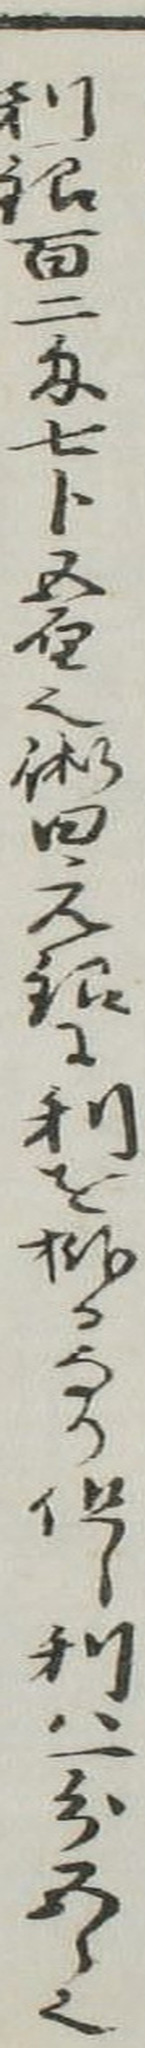利銀百二匁七分五厘也術曰元銀に利を掛るなり但し利は一分五厘也
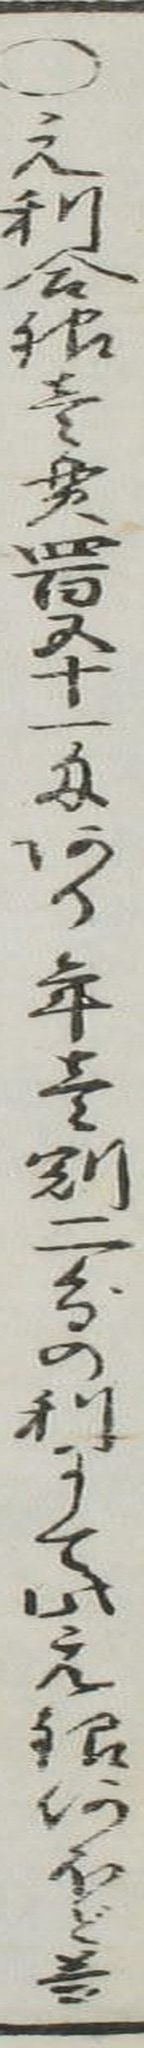○元利合銀壱貫四百五十一匁あり年壱割二分の利にて此元銀何ほど答
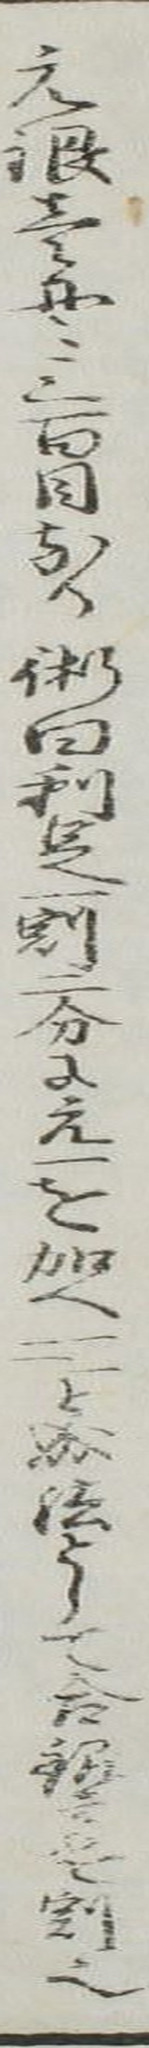元銀壱貫三百目なり術曰利足一割二分に元一を加へ一一二と成法として合銀高割也
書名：宝玉塵劫記
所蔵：東京学芸大学教育コンテンツアーカイブ
